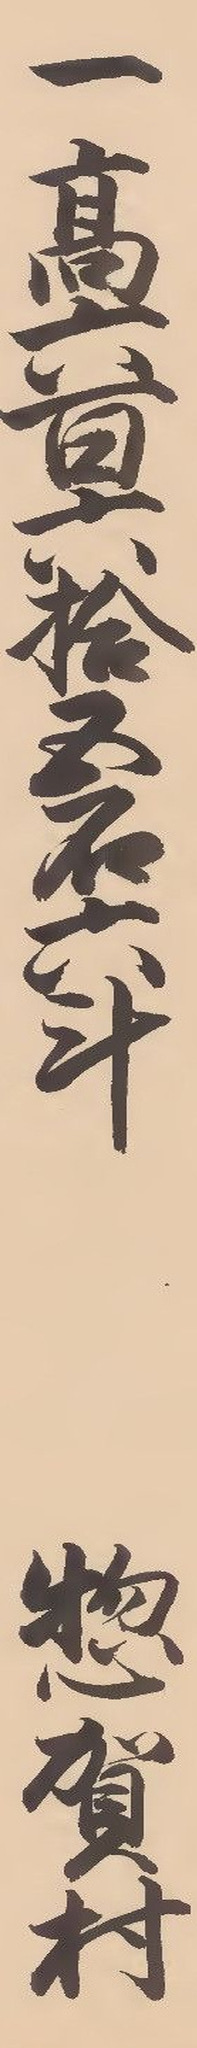一高六百六拾五石六斗惣賀村
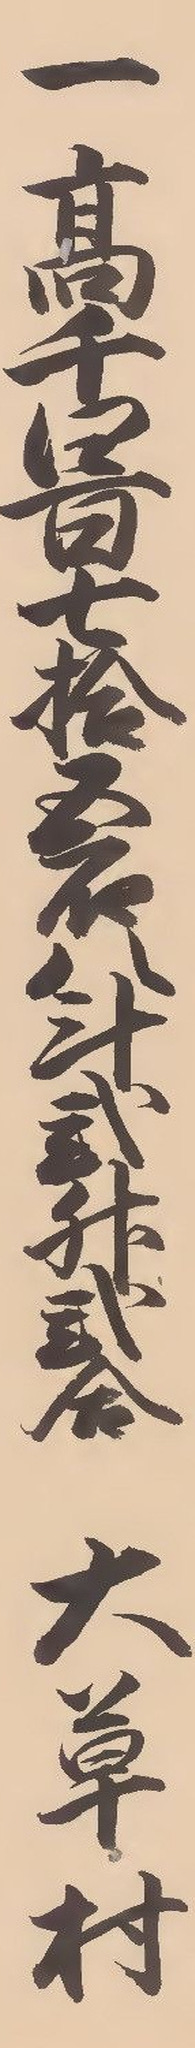一高千四百七拾五石八斗弐升弐合大草村
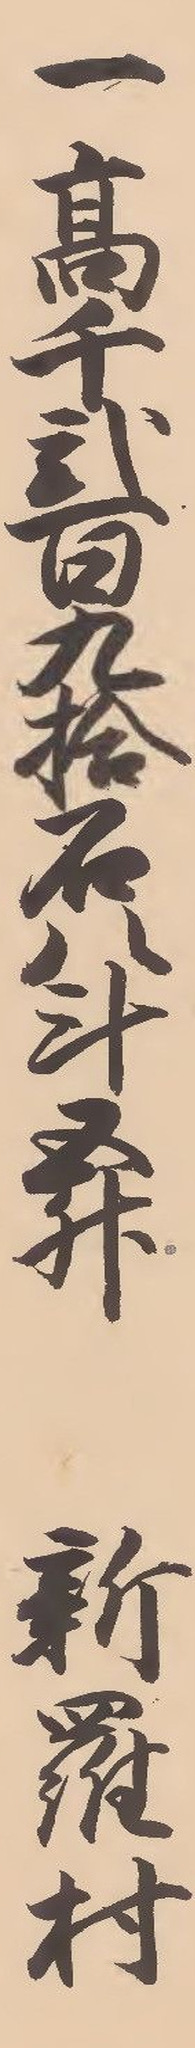一高千弐百九拾石八斗五升新羅村

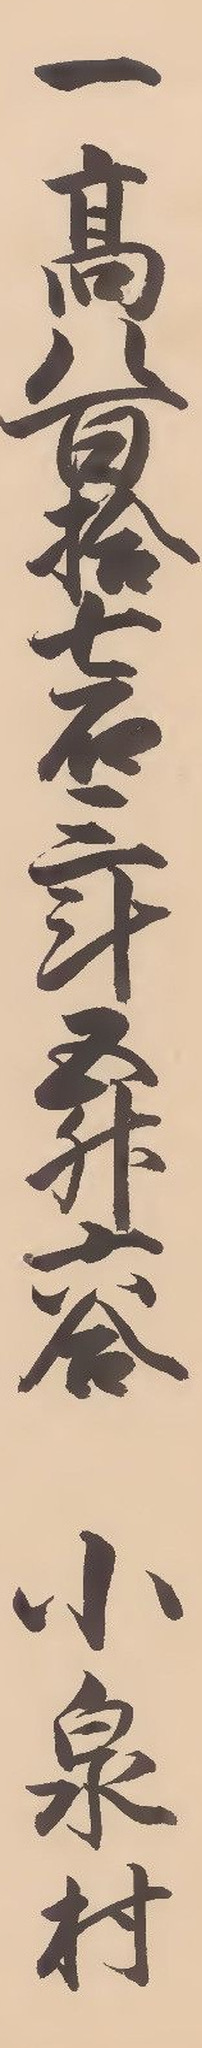一高八百拾七石三斗五升六合小泉村
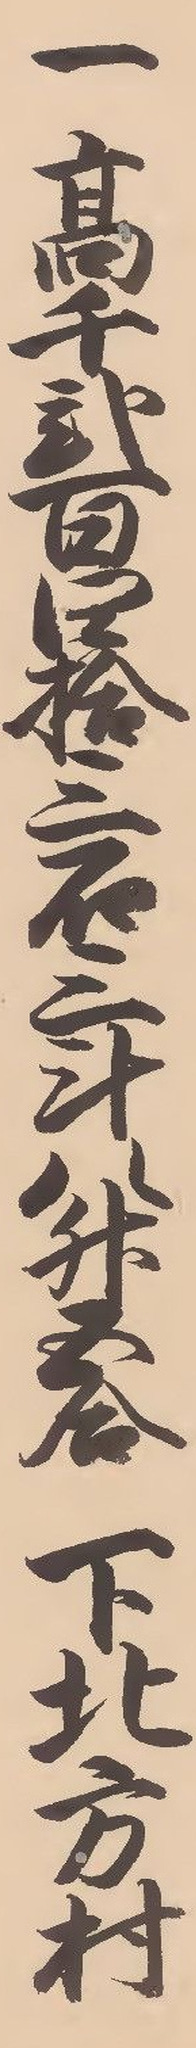一高千弐百四拾三石三斗八升五合下北方村
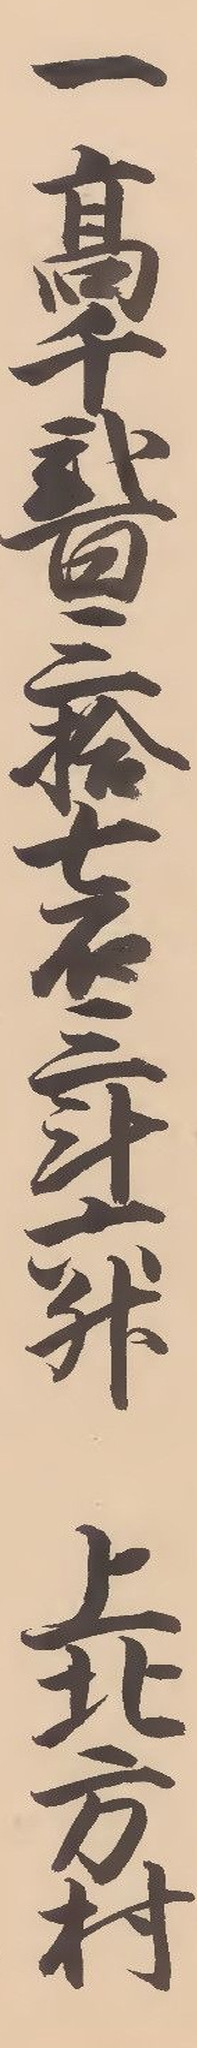一高千弐百三拾七石三斗六升上北方村
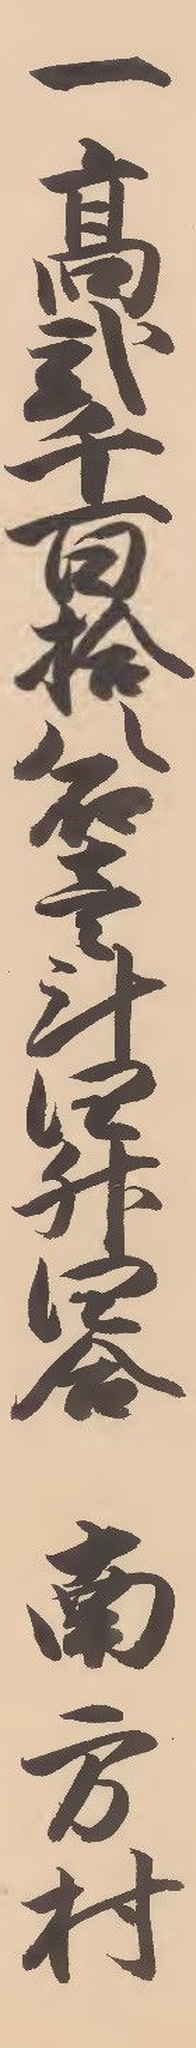一高弐千百拾八石壱斗四升四合南方村
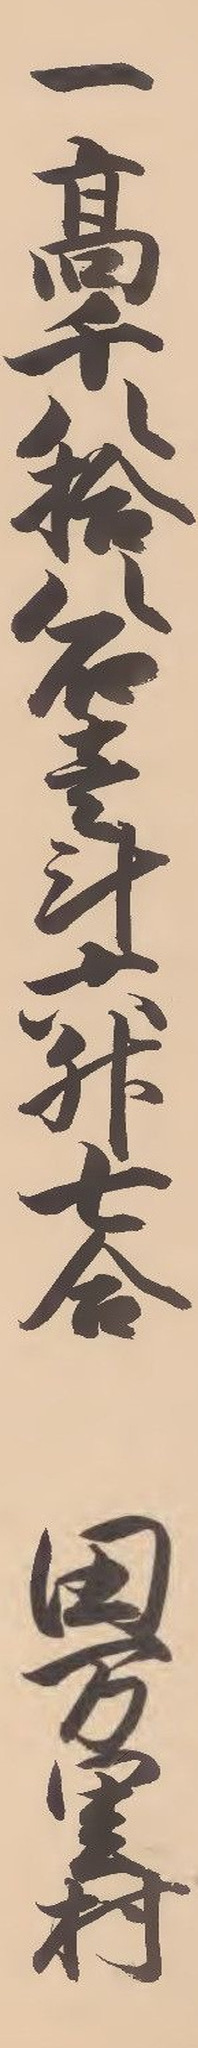一高千八拾八石壱斗六升七合田万里村
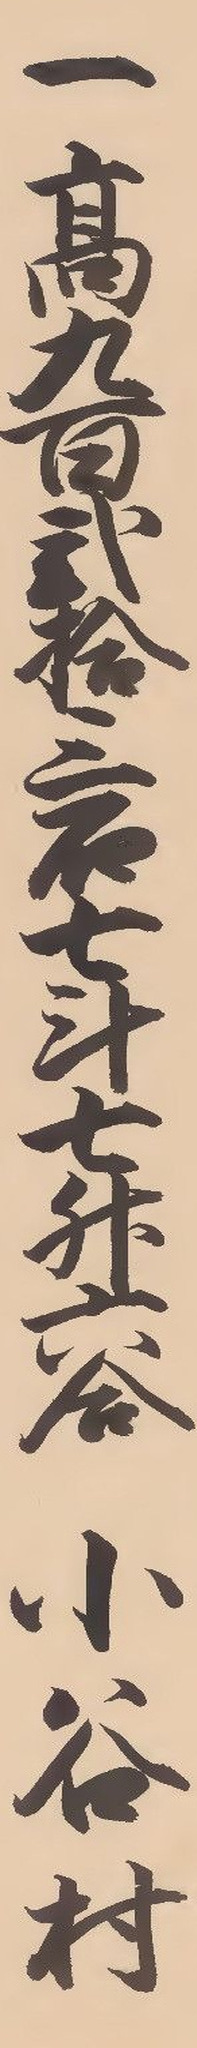一高九百弐拾三石七斗七升六合小谷村
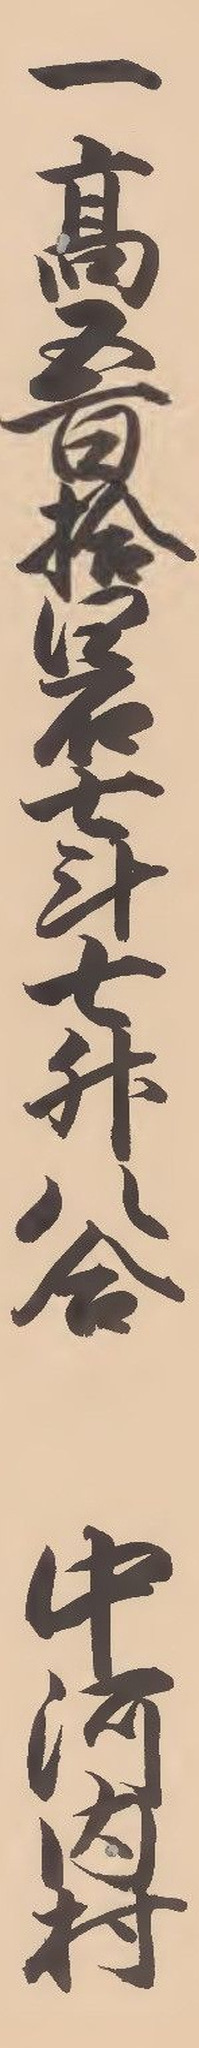一高五百拾四石七斗七升八合中河内村
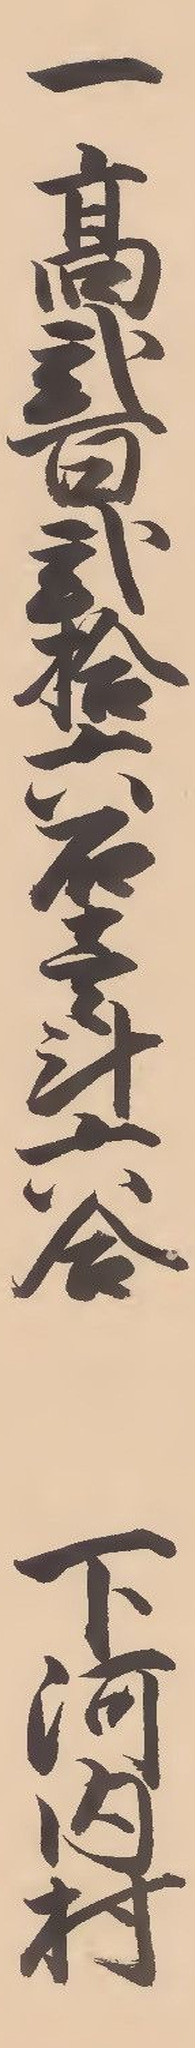一高弐百弐拾六石壱斗六合下河内村

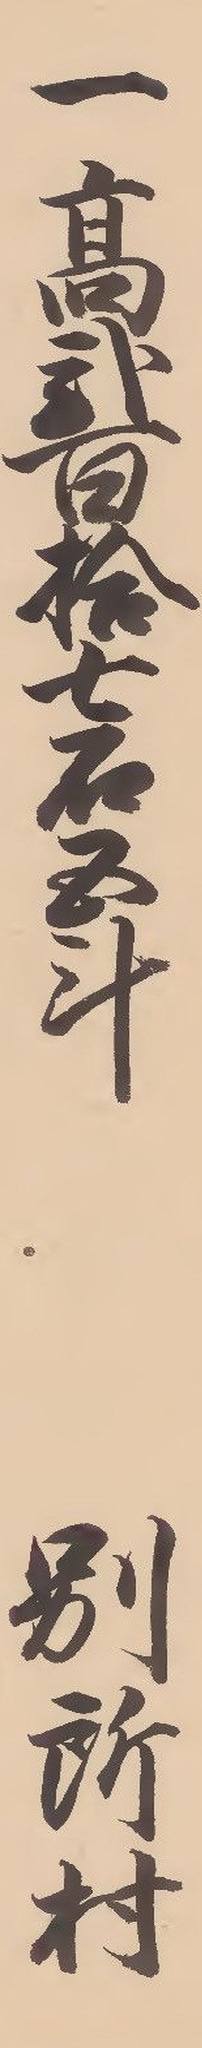一高弐百拾七石五斗別所村
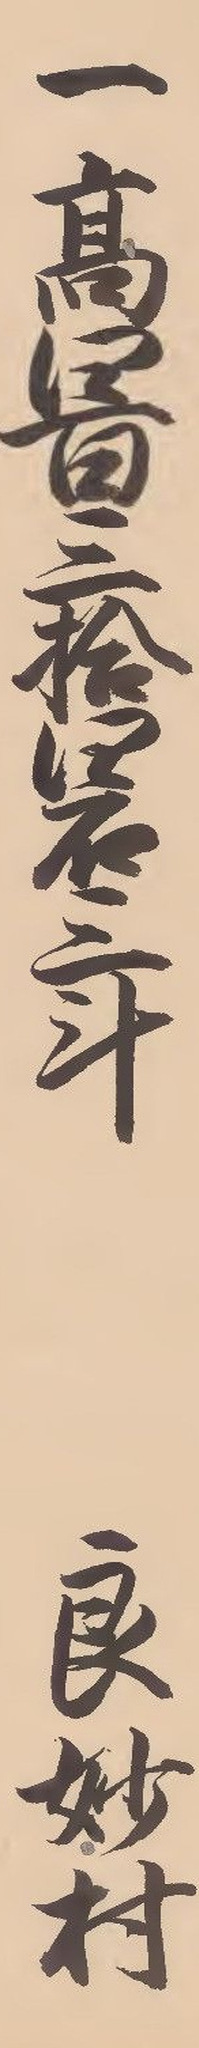一高四百三拾四石三斗良妙村
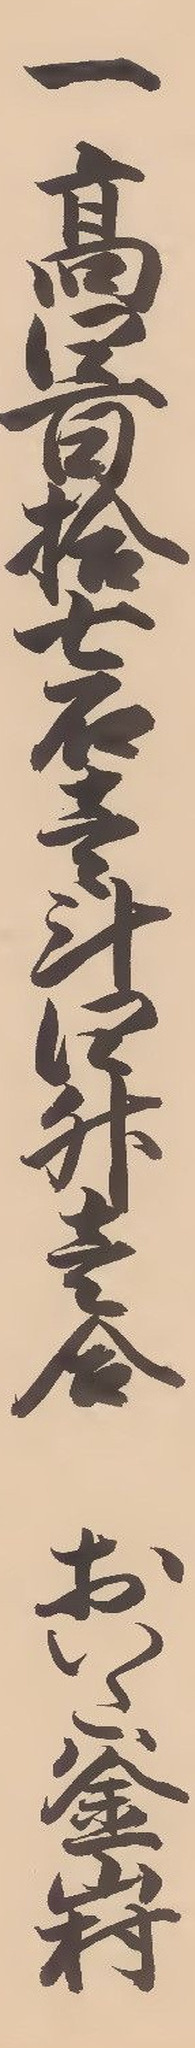一高四百拾七石壱斗四升壱合おいた釜山村
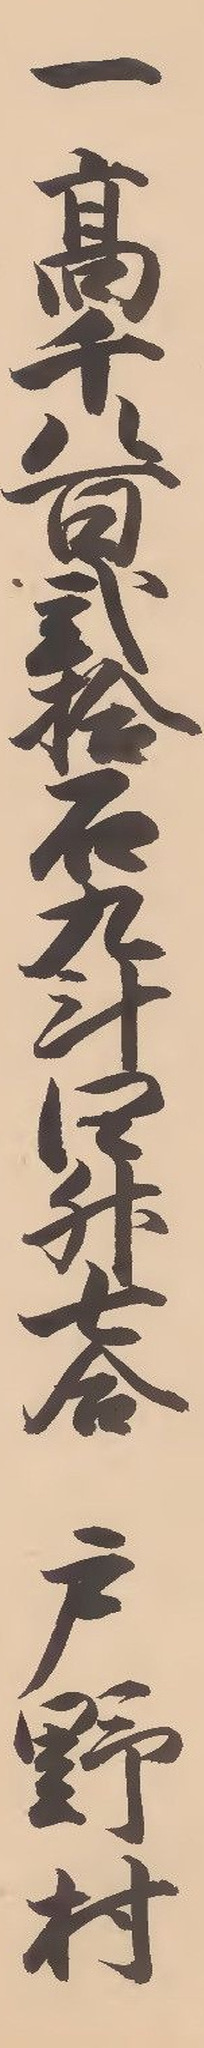一高千八百弐拾石九斗四升七合戸野村
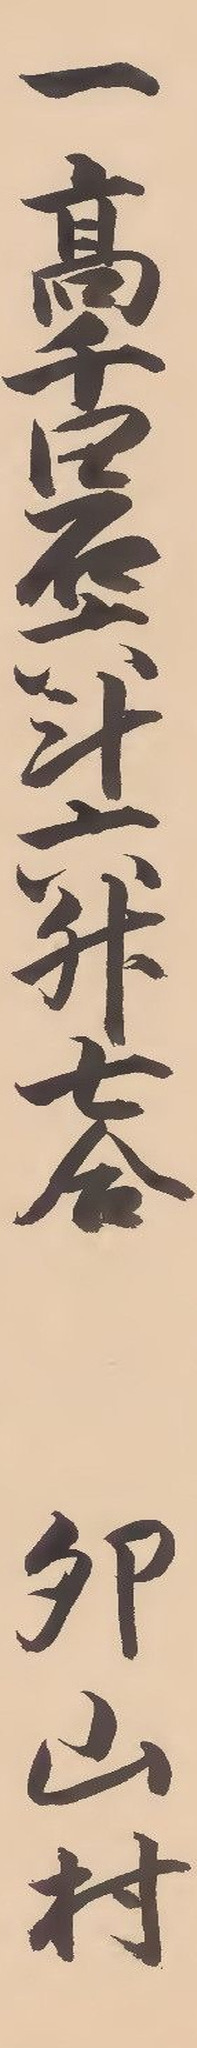一高千四石六斗六升七合卯山村
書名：安芸国郷帳
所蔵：国立公文書館 National Archives of Japan
